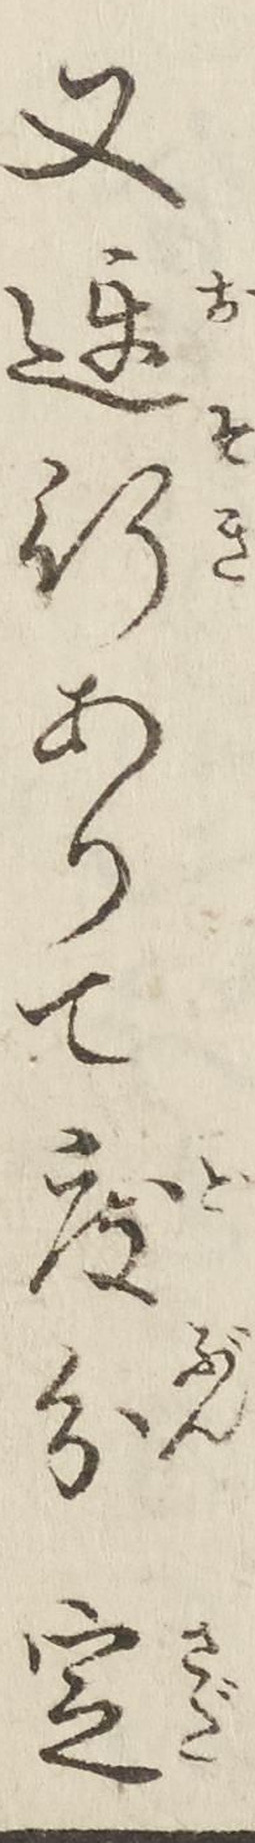又遅行ありて度分定
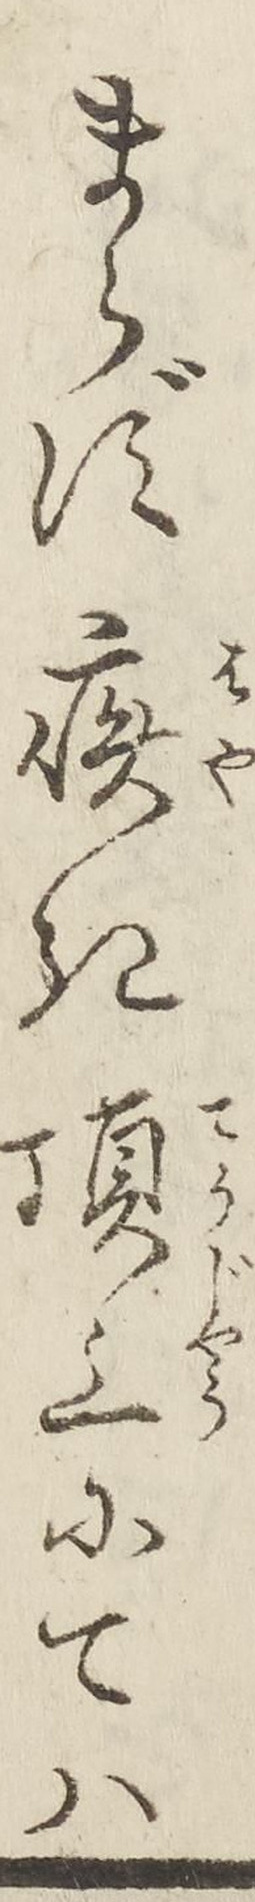まらず疾き頂上にては
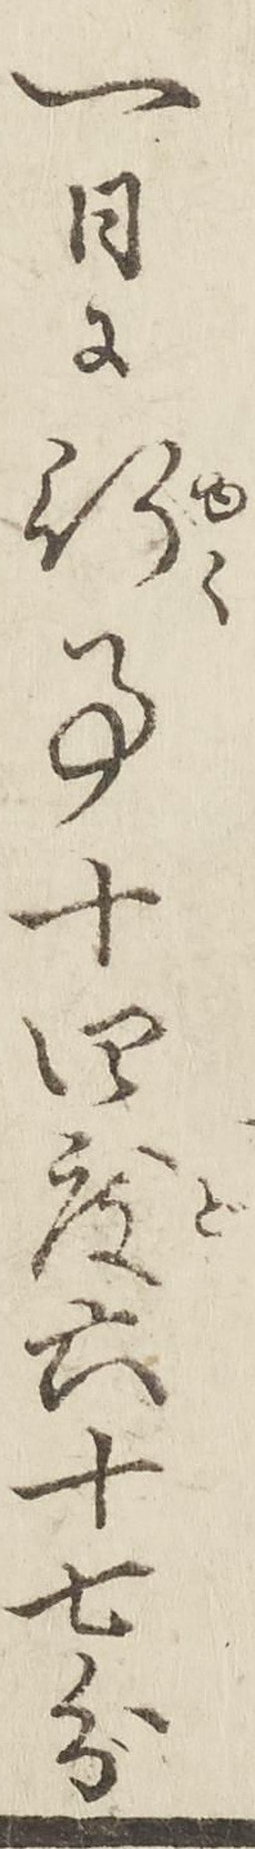一日に行事十四度六十七分
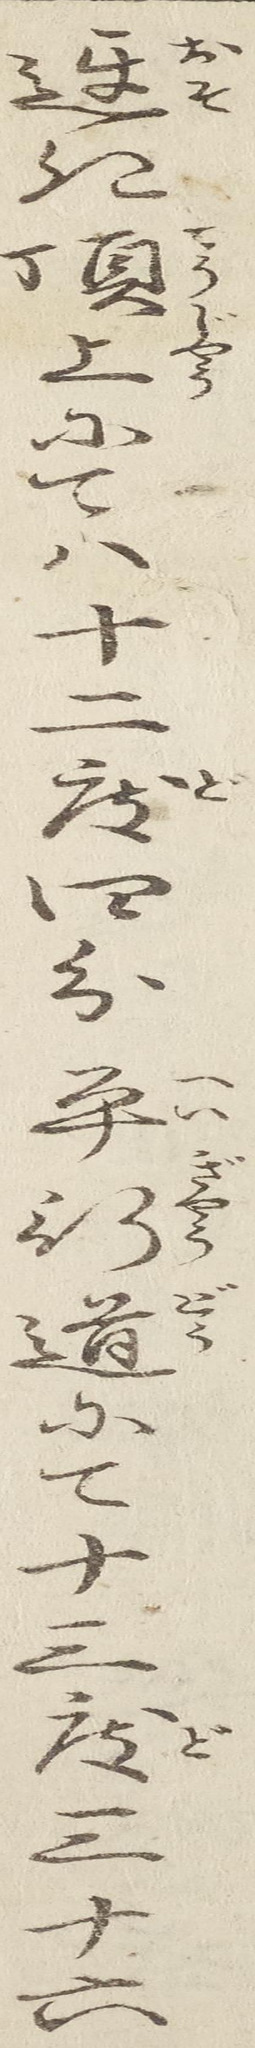遅き頂上にては十二度四分平行道にて十三度三十六
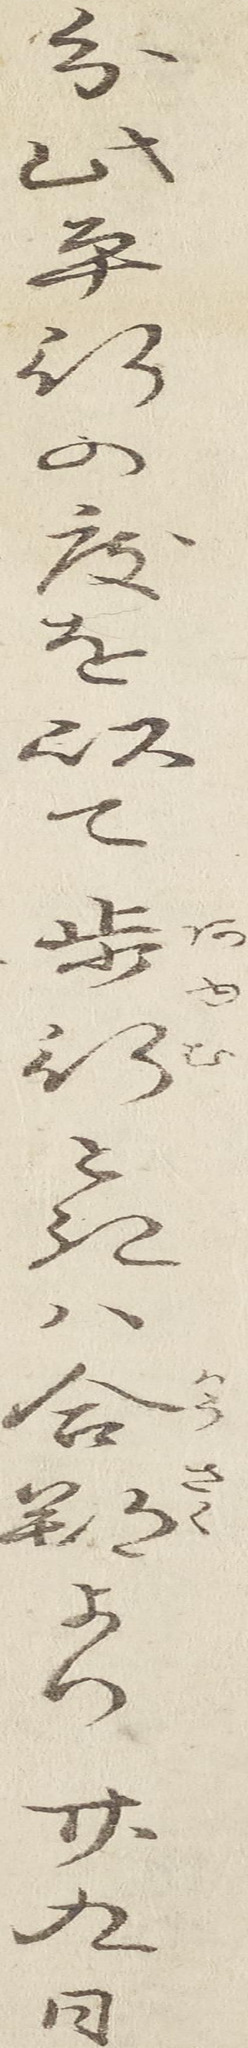分此平行の度を以て歩行ときは合朔より廿九日
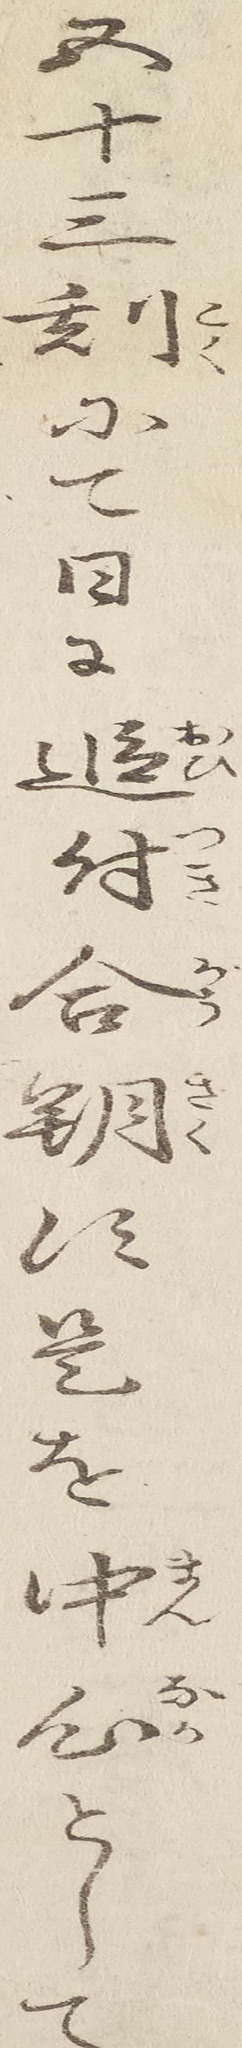五十三刻にて日に追付合朔す是を中心として
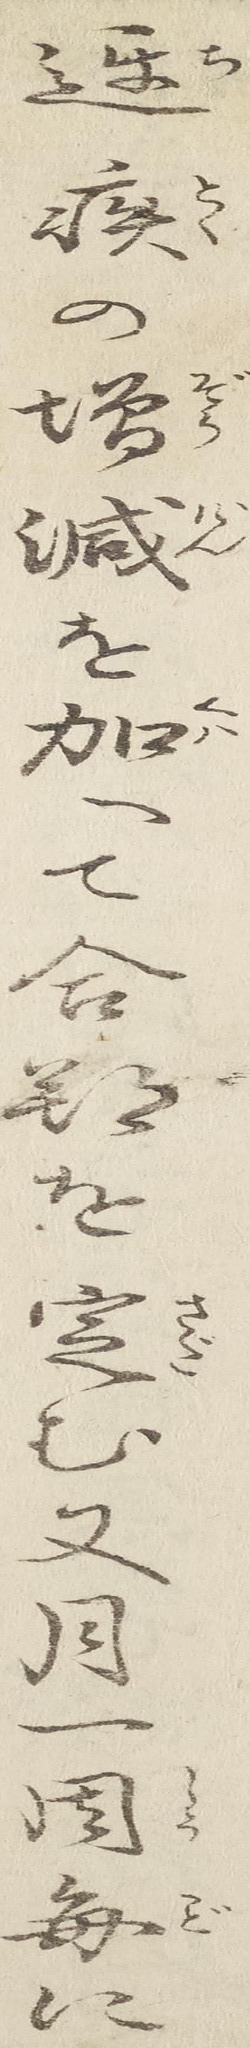遅疾の増減を加へて合朔を定む又月一周毎に
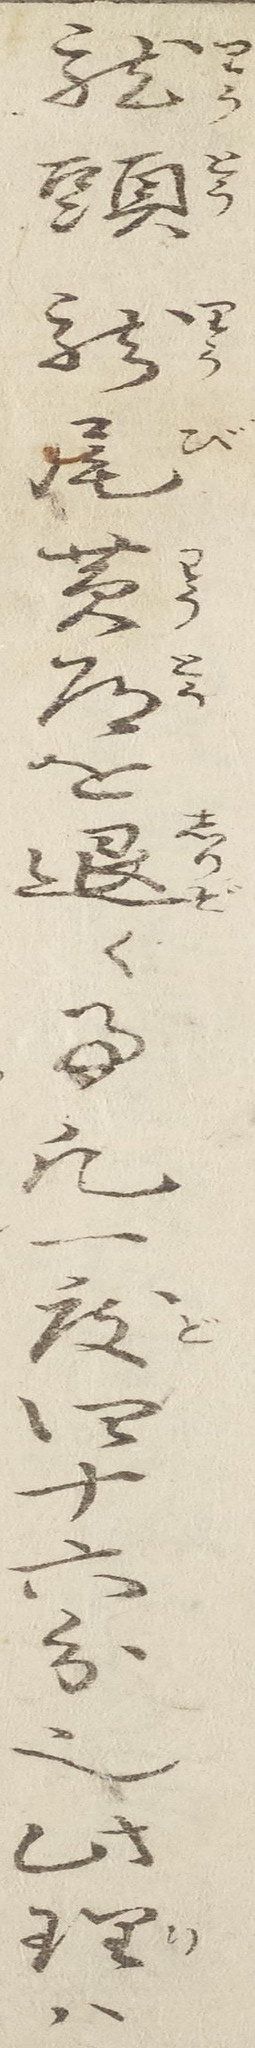龍頭龍尾黄道を退く事凡一度四十六分也此理は
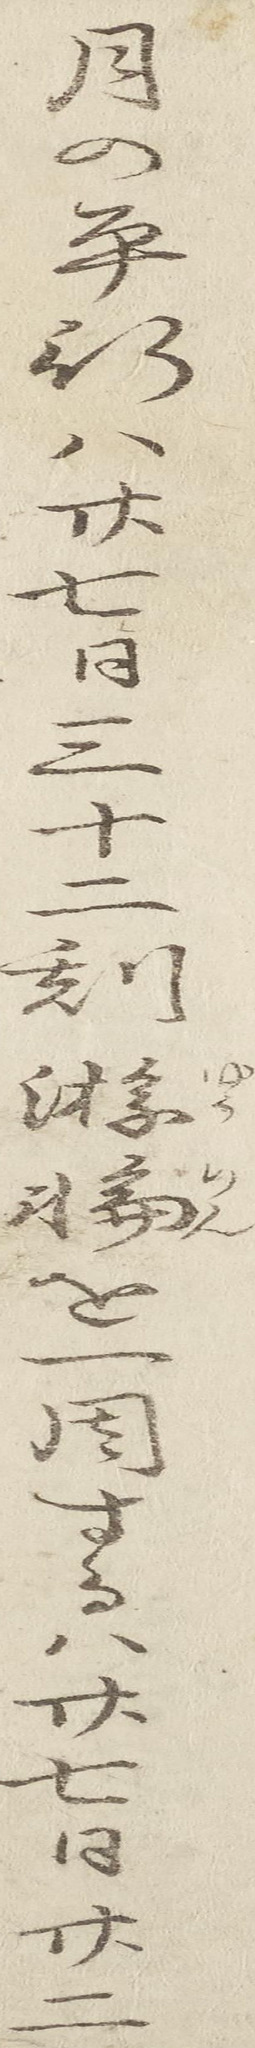月の平行は廿七日三十二刻游輪を一周するは廿七日廿二
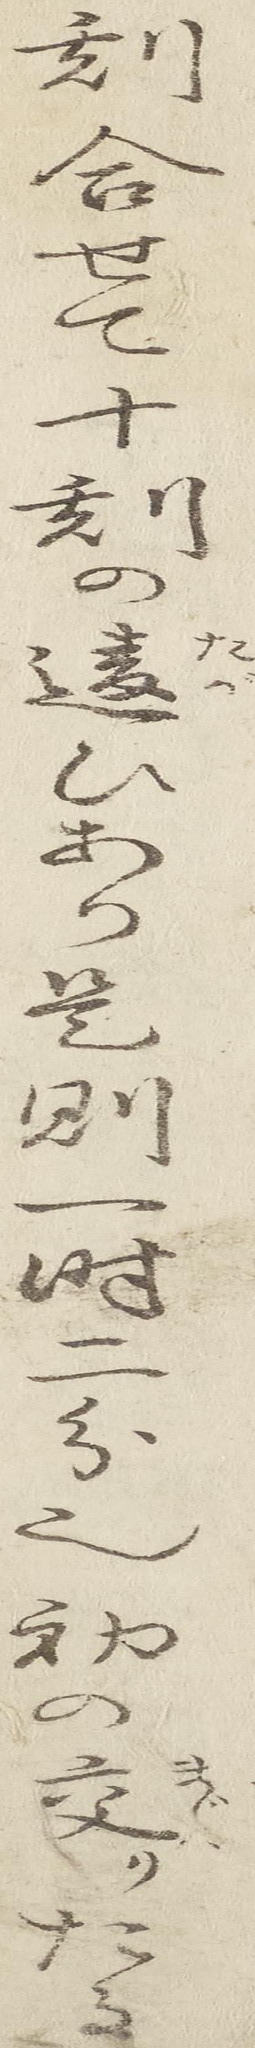刻合せて十刻の違ひあり是則一時二分也初の交りたる
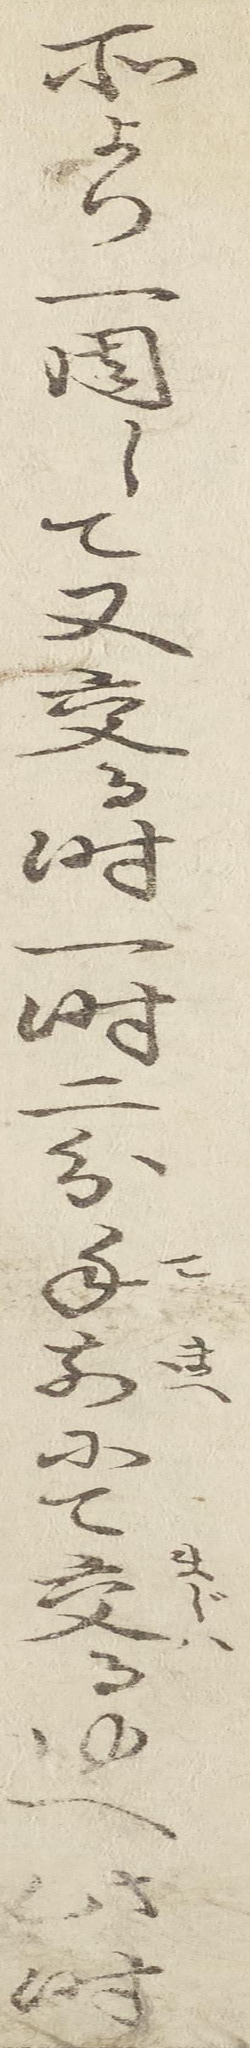所より一周して又交る時一時二分手前にて交るゆへ此時
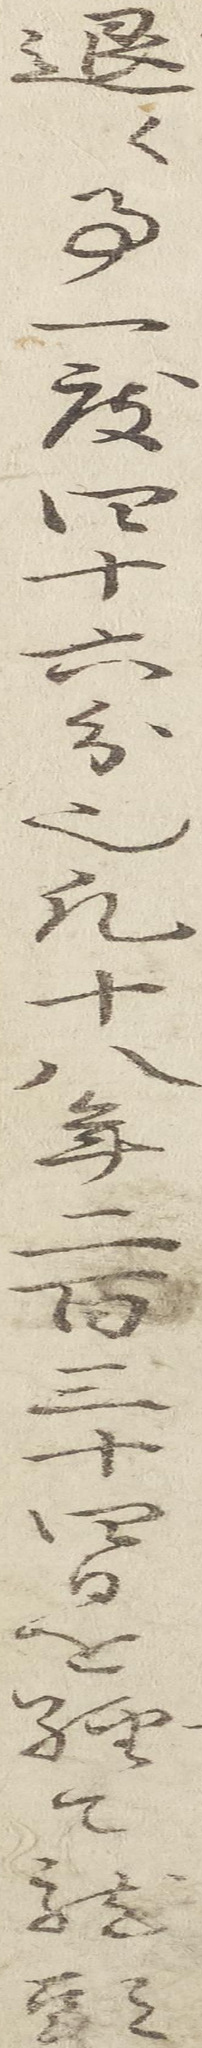退く事一度四十六分也凡十八年二百三十四日を経て龍頭
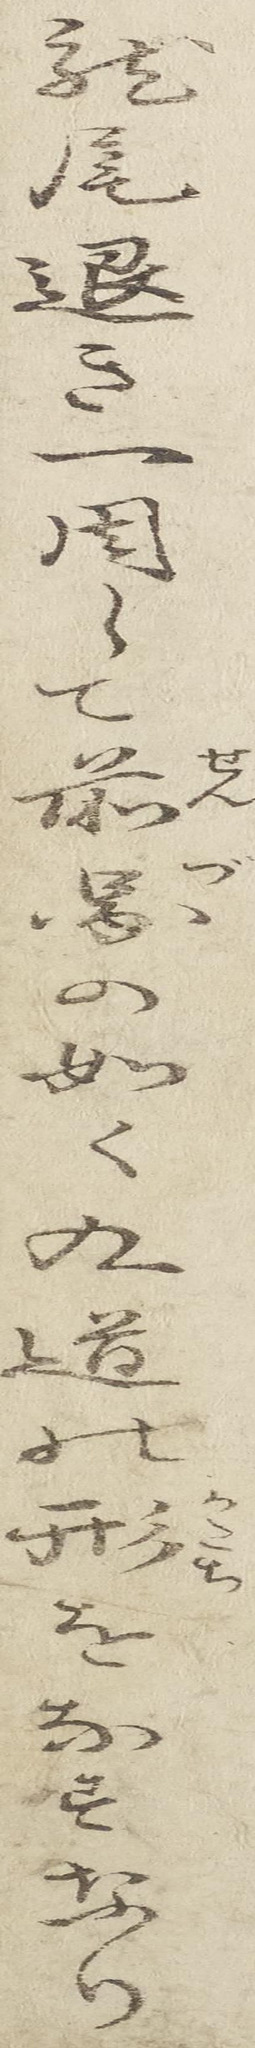龍尾退き一周して前図の如く九道の形をなすなり

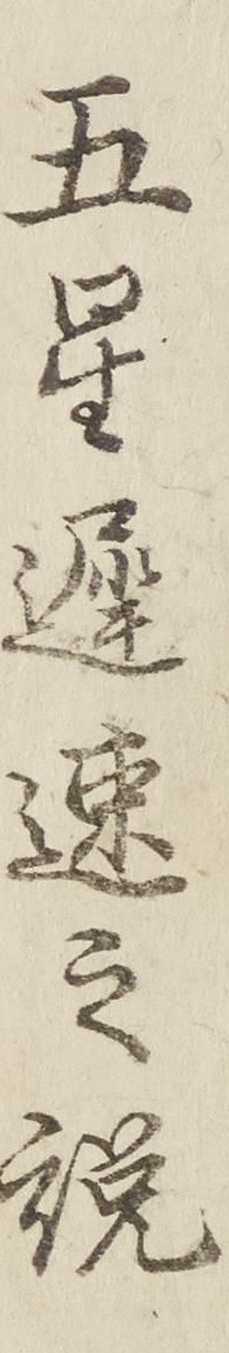五星遅速之説
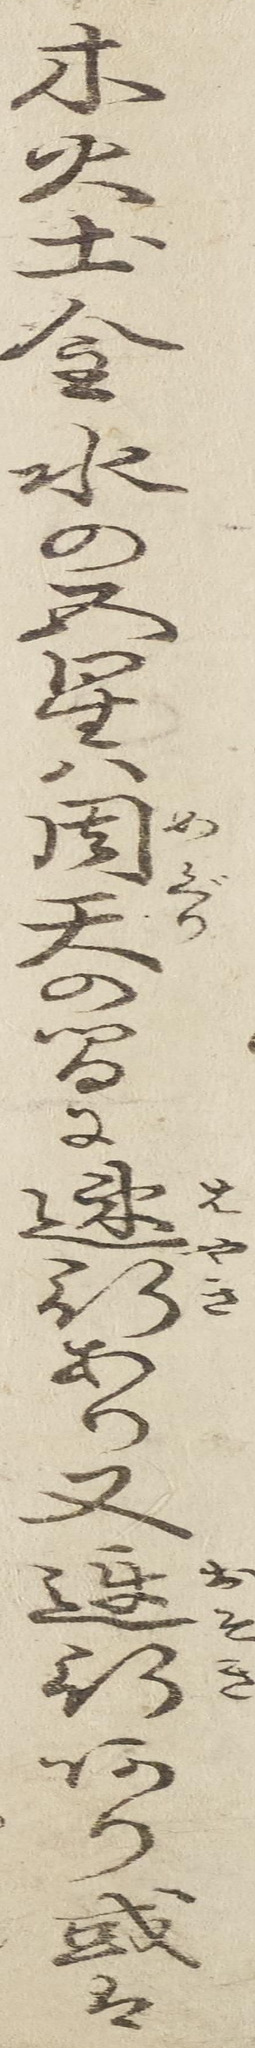木火土金水の五星は周天の間に速行あり又遅行あり或は
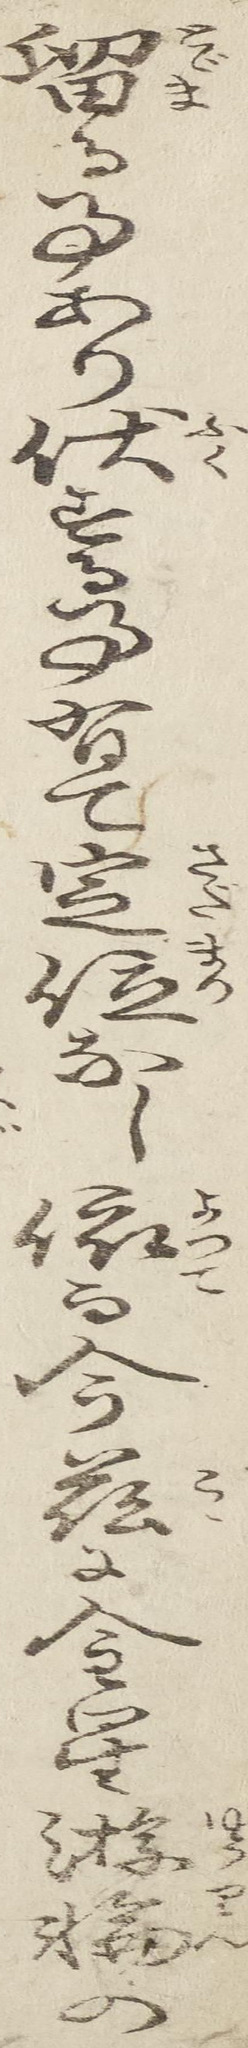留る事あり伏する事有て定位なし依而今茲に金星游輪の
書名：平天儀圖解
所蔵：東京大学地震研究所図書室 Earthquake Research Institute Library, The University of Tokyo, JAPAN
